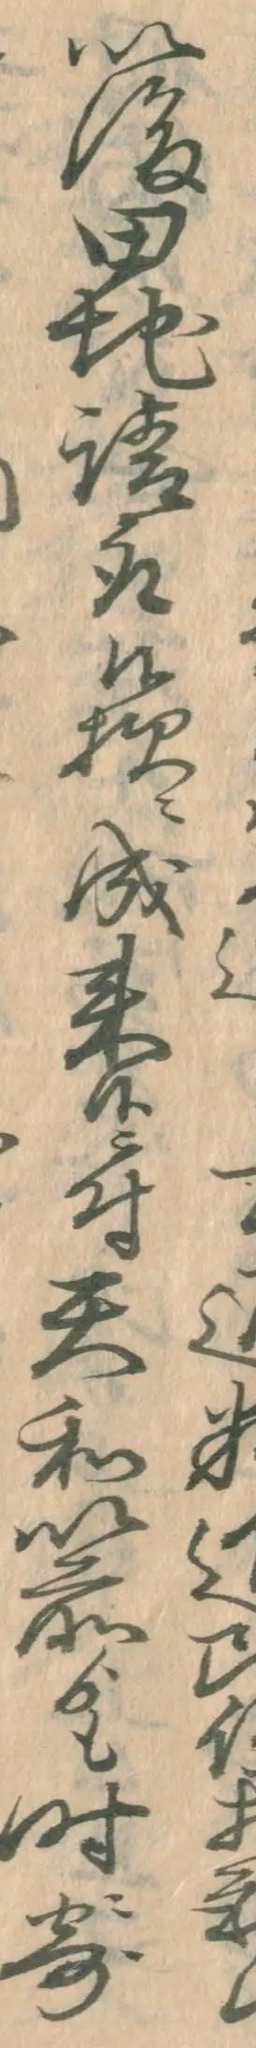以後田地請取候様ニ成来候ニ付天和以前ゟも時々寄
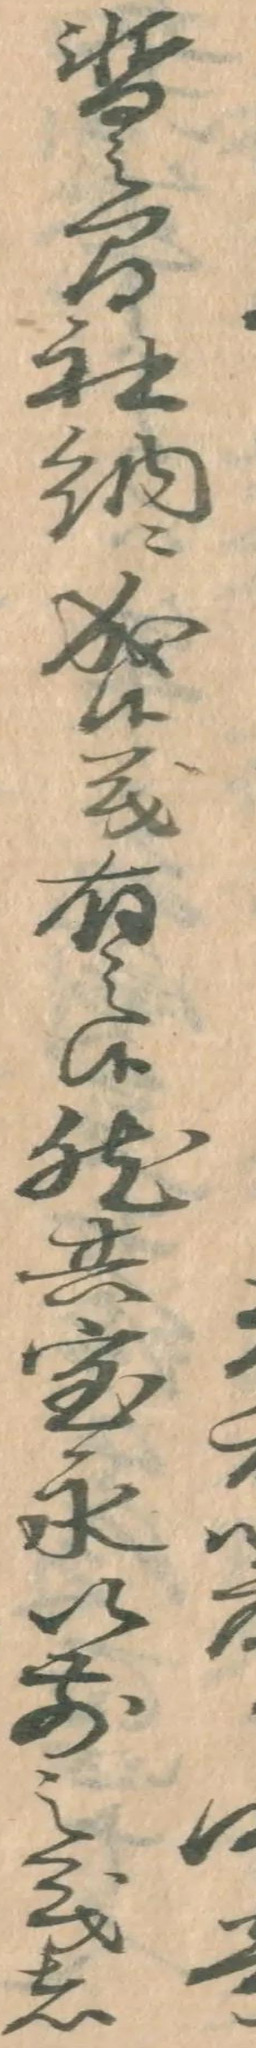暫之間社納二成候義有之候然共宝永以前之義者
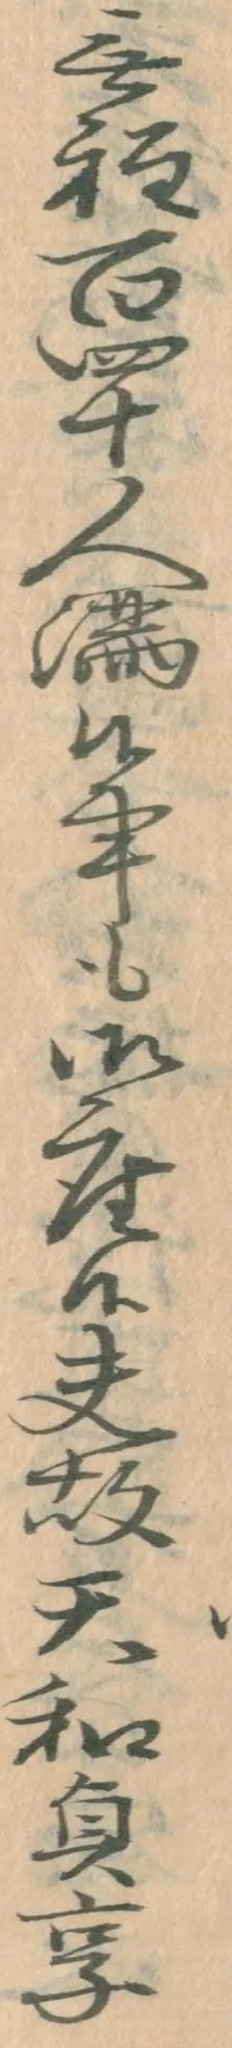無程百四十人満候事も御座候夫故天和貞享

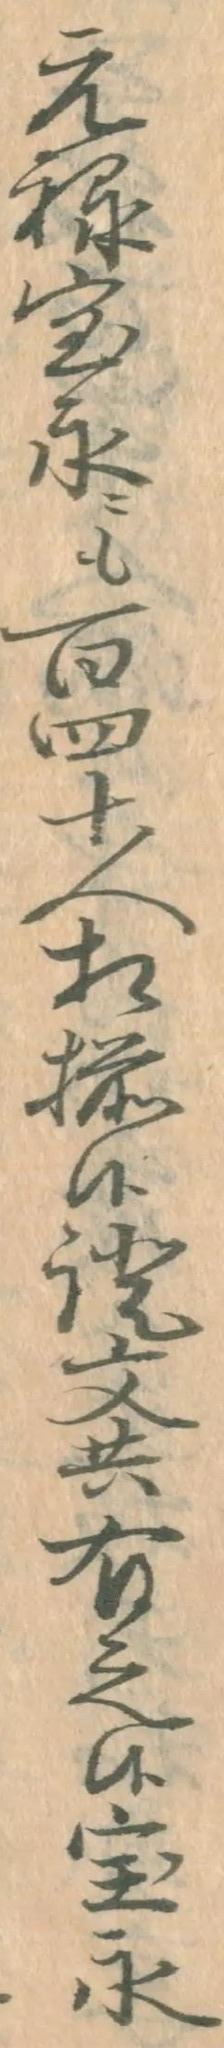元禄宝永ニも百四十人相揃候證文共有之候宝永
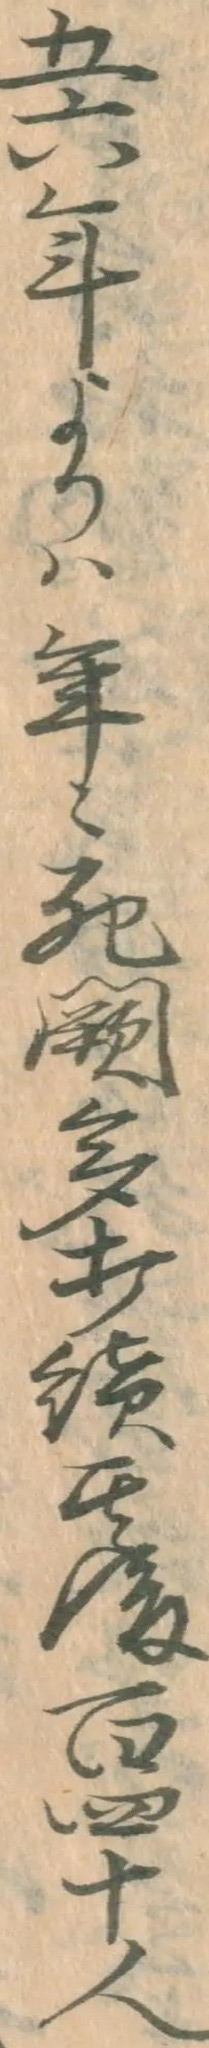五六年よりハ年〻死闕多打続其後百四十人
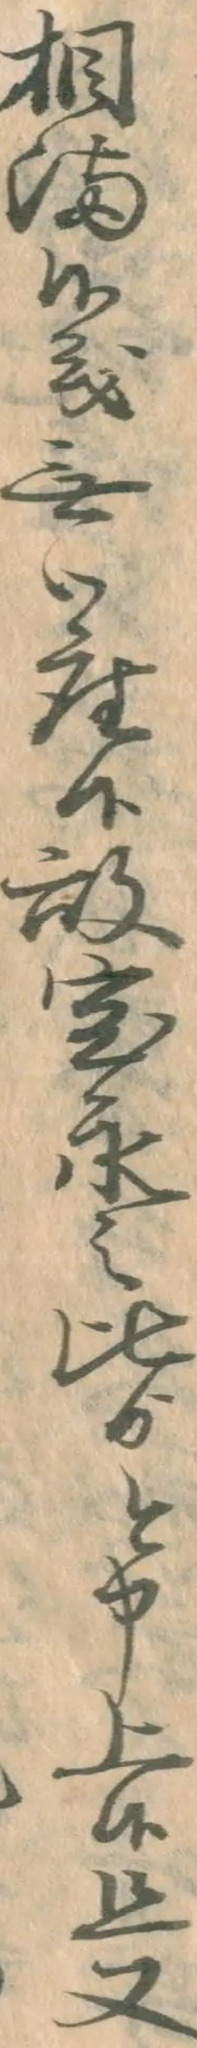相満候義無御座候故宝永之比ゟと申上候且又
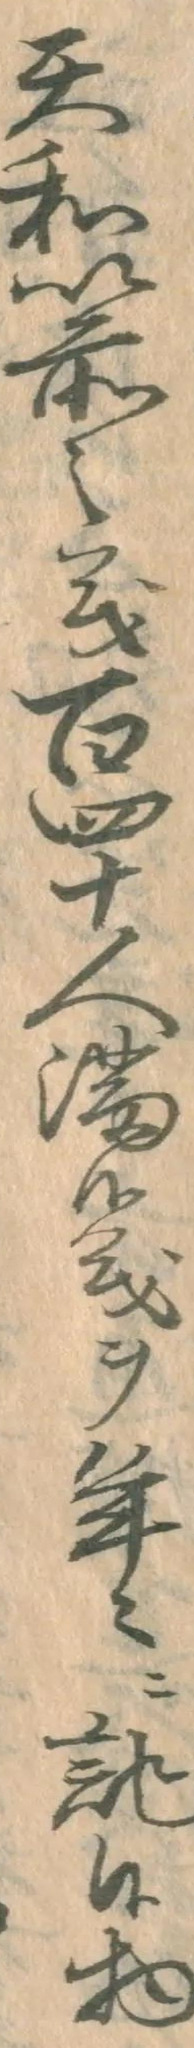天和以前之義百四十人満候義ヲ年々ニ記候物
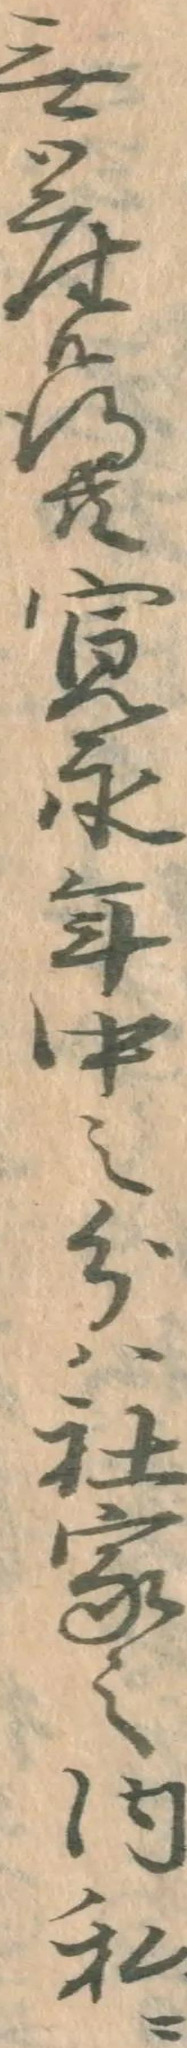無御座候得共寛永年中之分ハ社家之内私に
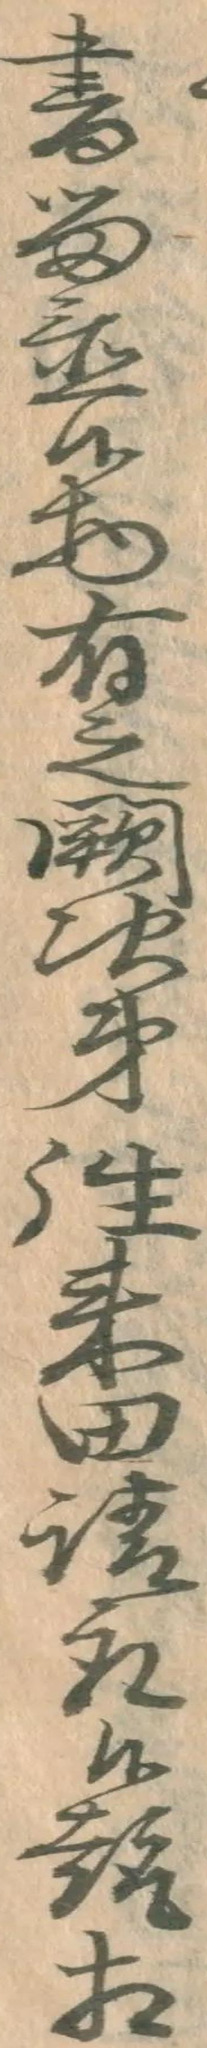書留置候物有之闕次第往来田請取候趣相
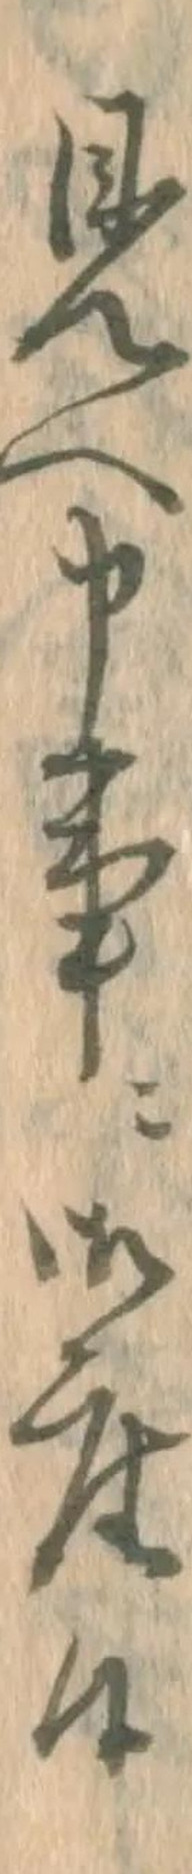見へ申事ニ御座候
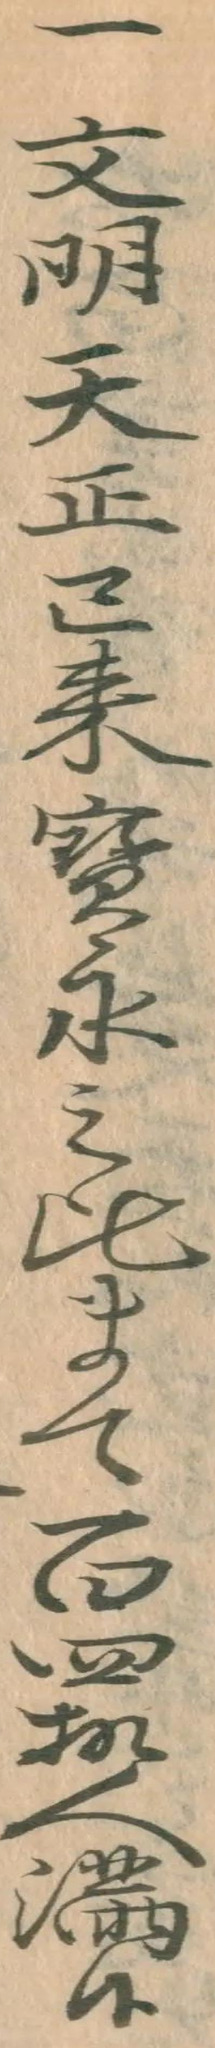一、文明天正已来寶永之比まて百四拾人満候
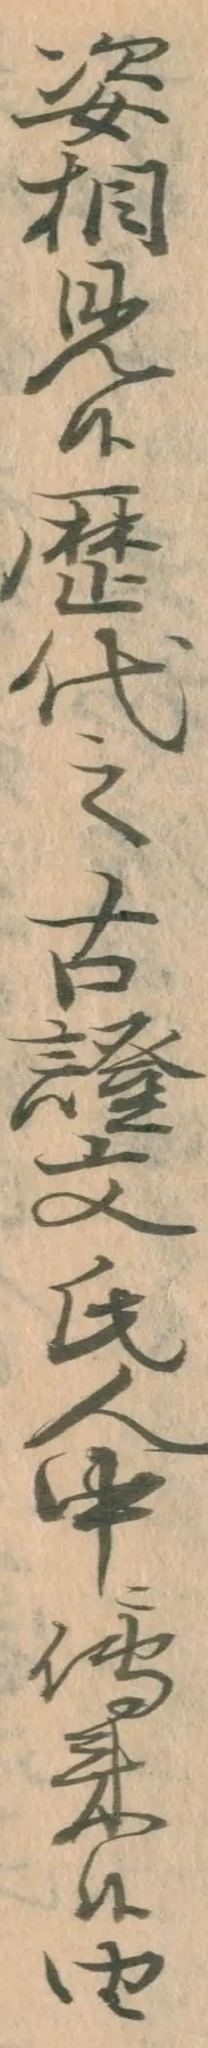姿相見候歴代之古證文氏人中ニ傳来候由
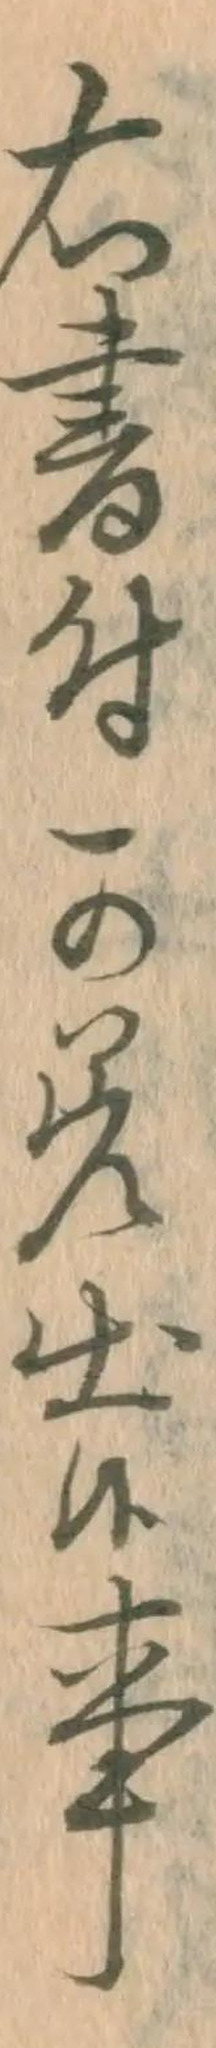右書付可差出候事
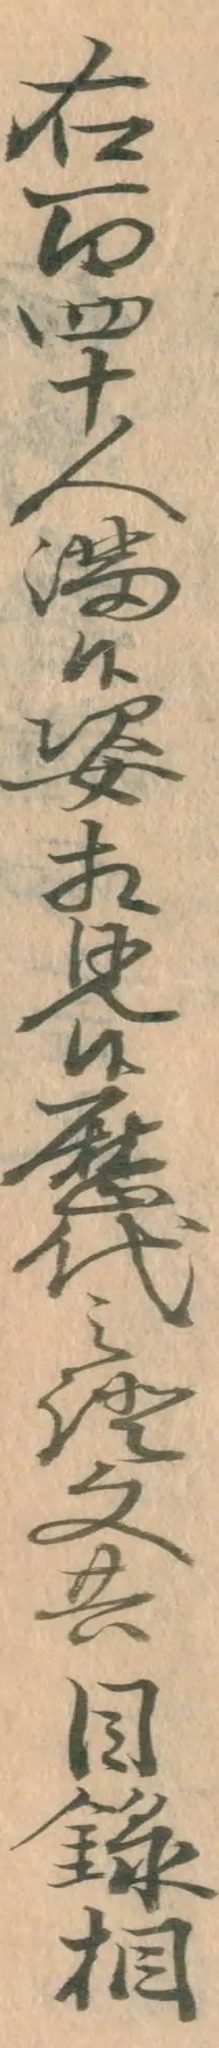右百四十人満候姿相見候歴代之證文共目録相
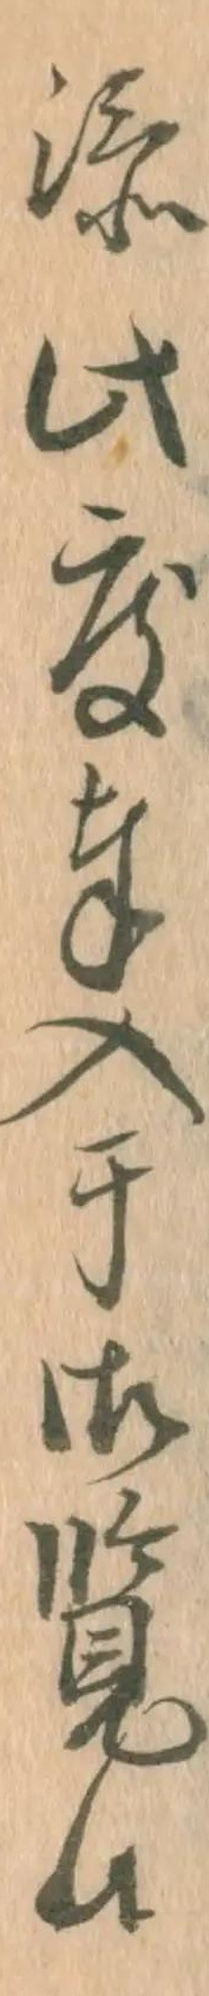添此度奉入于御覧候
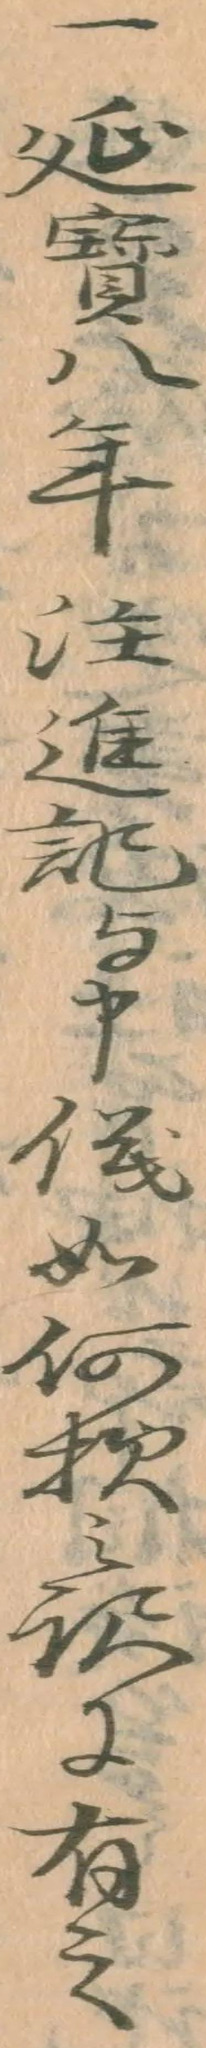一、延寶八年注進記と申儀如何様之訳に有之
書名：賀茂社記録. 第39冊
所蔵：国立国会図書館 National Diet Library, JAPAN
